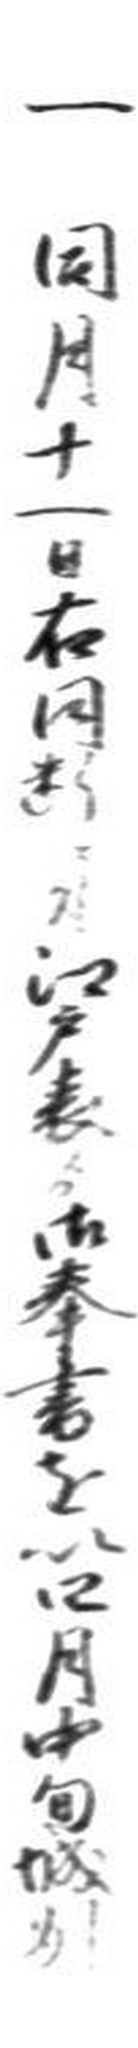一同月十一日右同断ニ付江戸表ゟ御奉書を以四月中旬城州
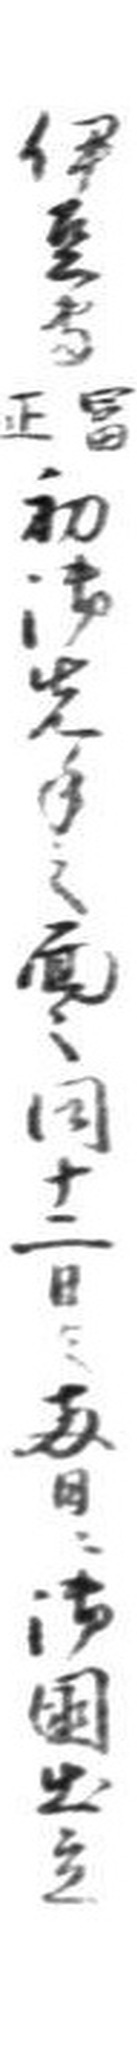正初御先手之面々同十二日之両日ニ御国出立
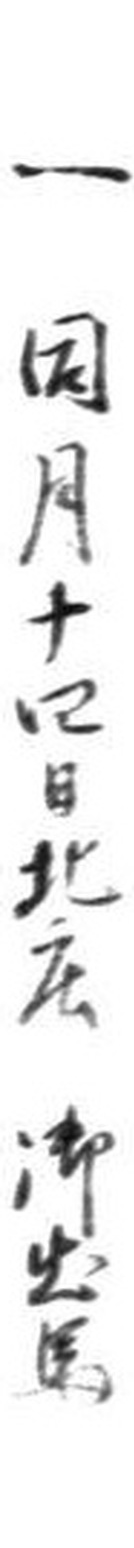一同月十四日北庄御出馬
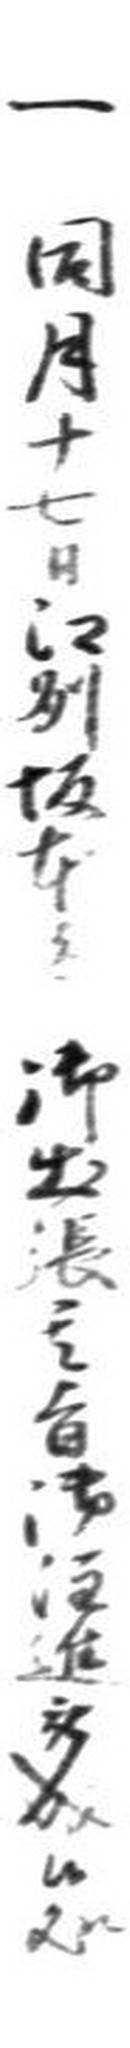一同月十七日江州坂本迄御出張其旨御注進被成候処

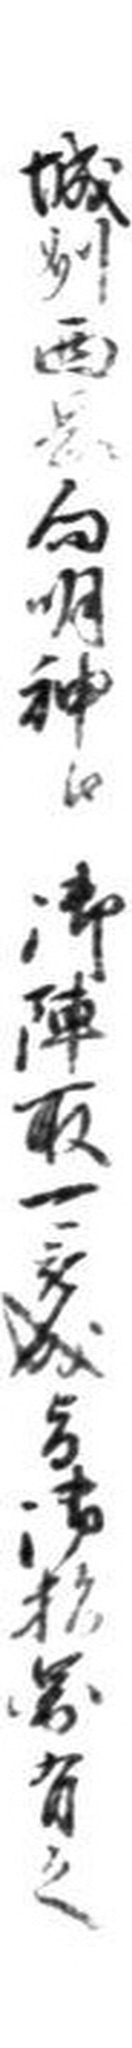城州西岡向明神江御陣取可被成旨御指図有之
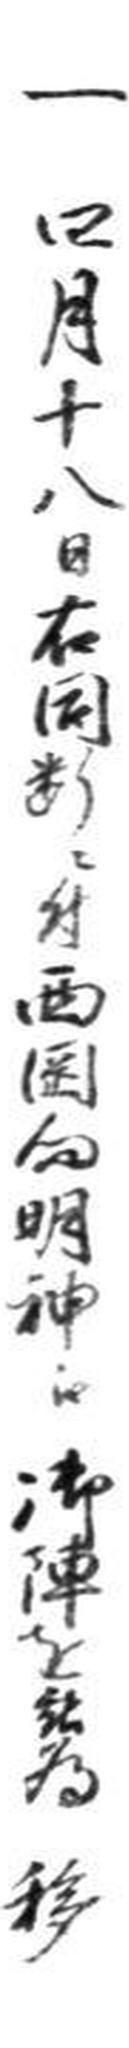一四月十八日右同断ニ付西岡向明神江御陣を被為移
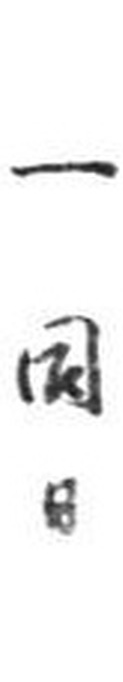一同日
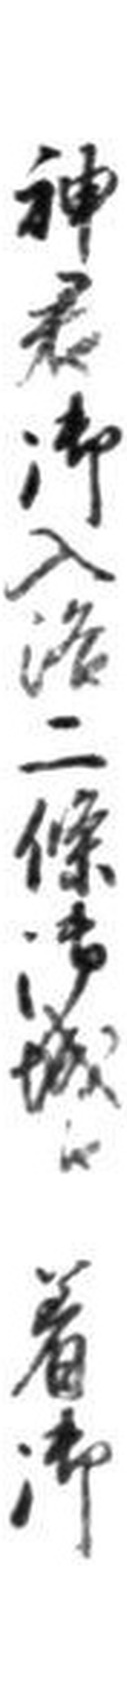神君御入洛二條御城江着御
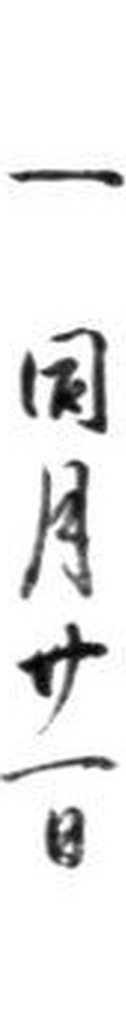一同月廿一日
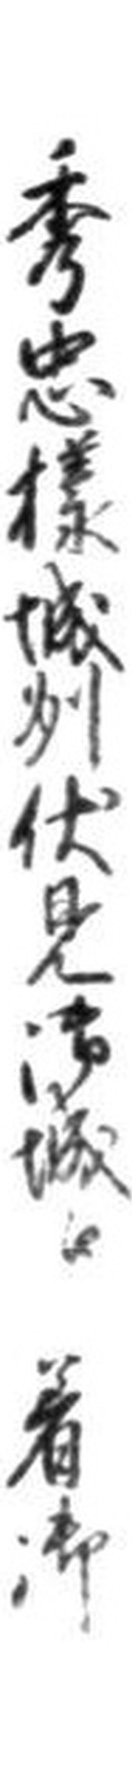秀忠様城州伏見御城江着御
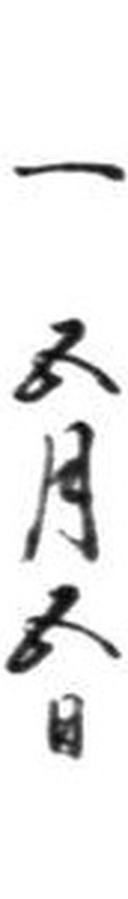一五月五日
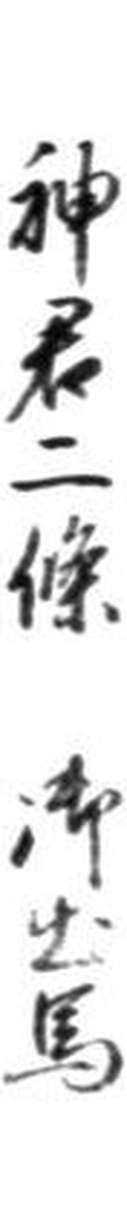神君二條御出馬
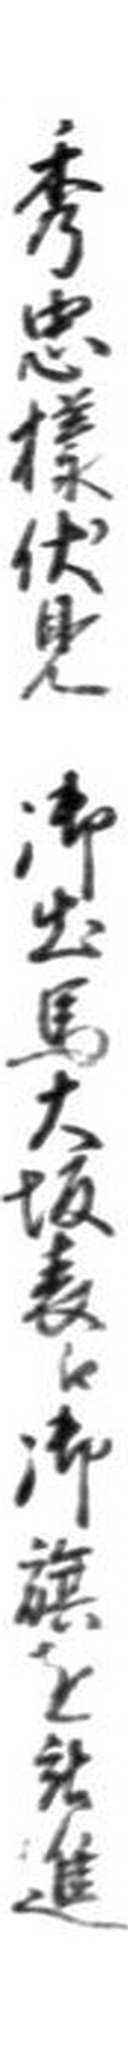秀忠様伏見御出馬大坂表江御旗を被進
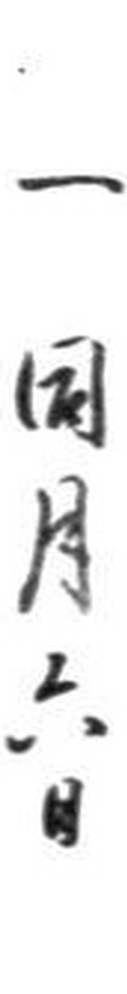一同月六日
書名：家譜 二 忠直公 従文禄四年到慶安四年
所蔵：福井県文書館 Fukui Prefectural Archives
